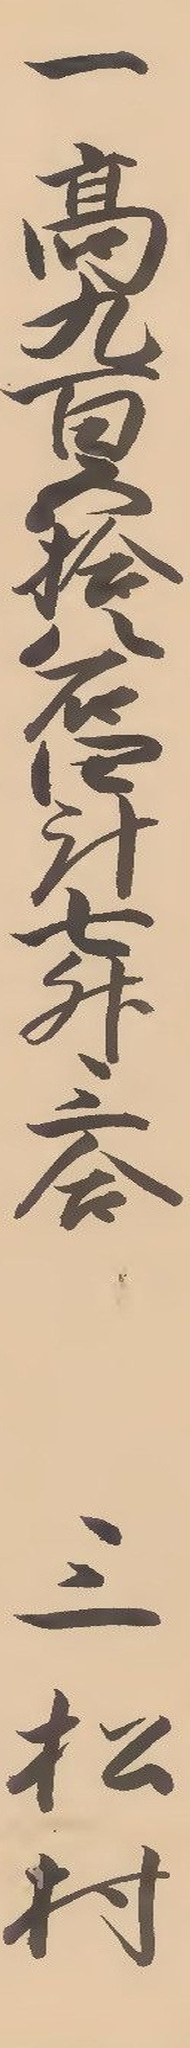一高九百五拾八石四斗七升三合三松村

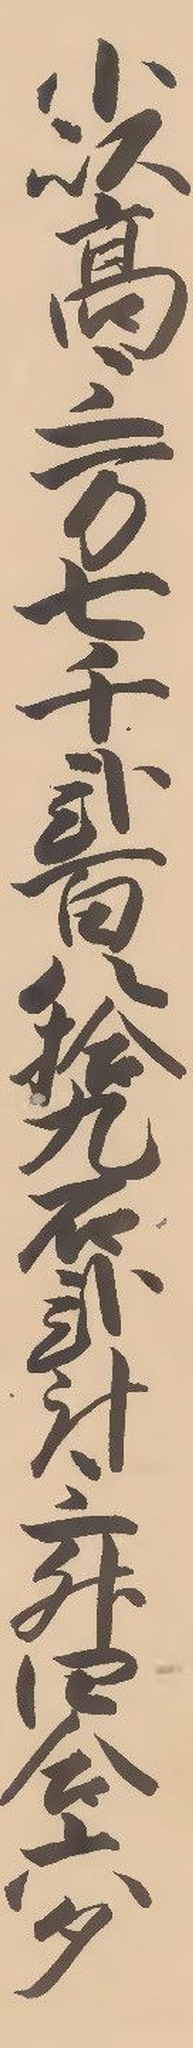小以高三万七千弐百八拾九石弐斗三升四合六勺
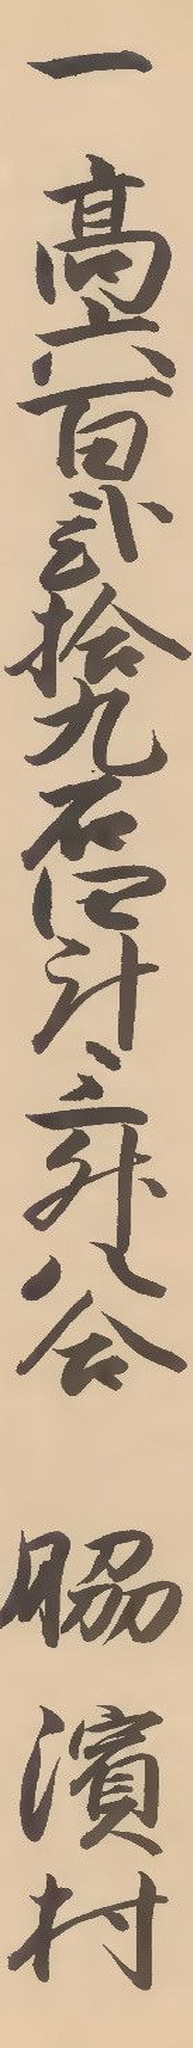一高六百弐拾九石四斗三升八合脇浜村
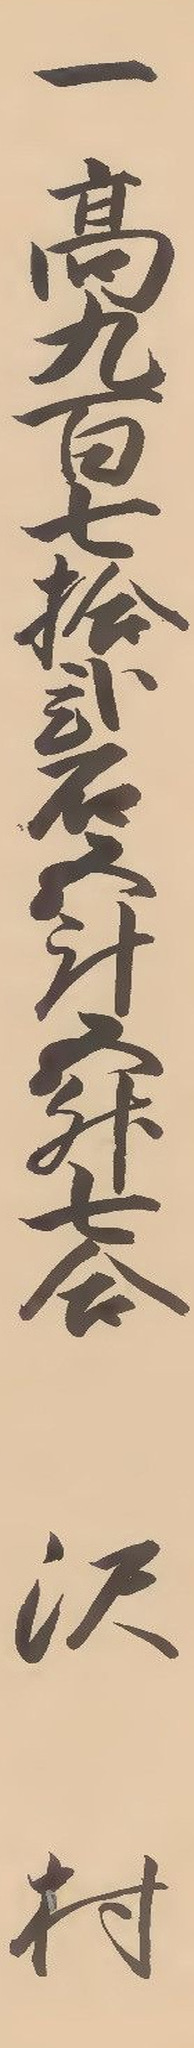一高九百七拾弐石五斗五升七合沢村
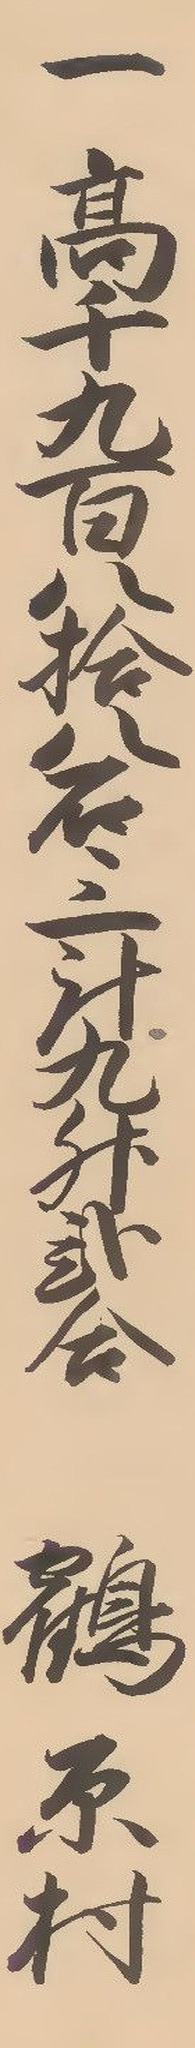一高千九百八拾八石三斗九升弐合鶴原村

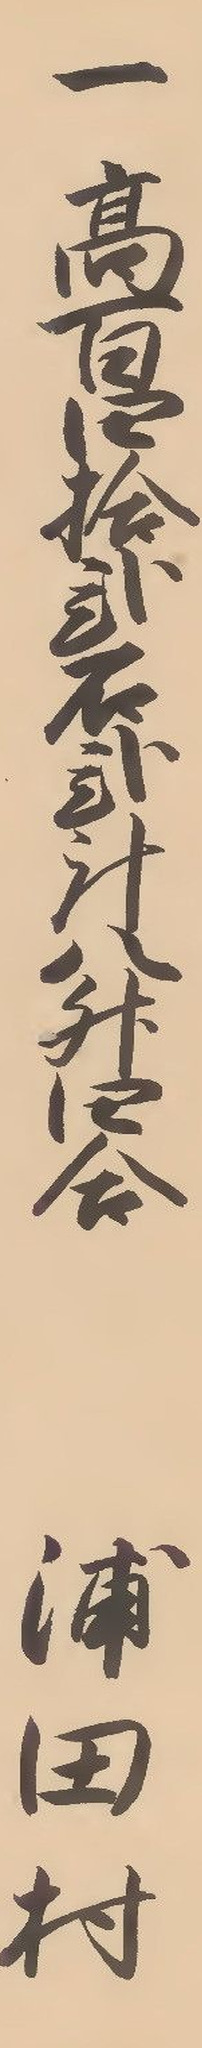一高百四拾弐石弐斗八升四合浦田村
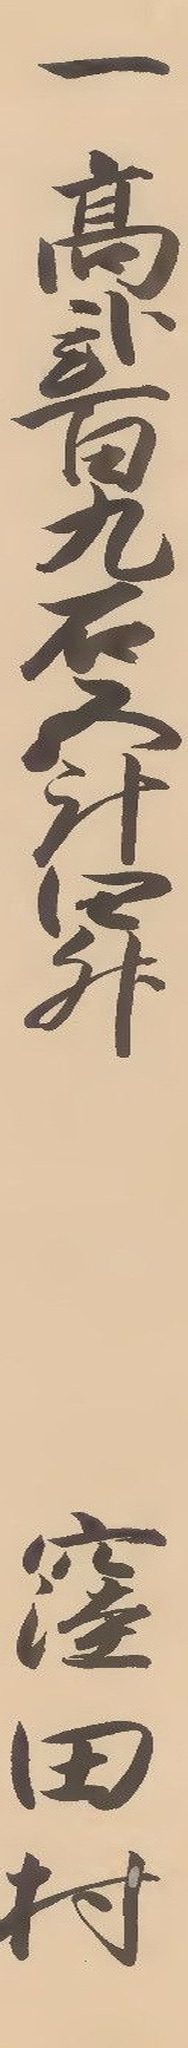一高弐百九石五斗四升窪田村
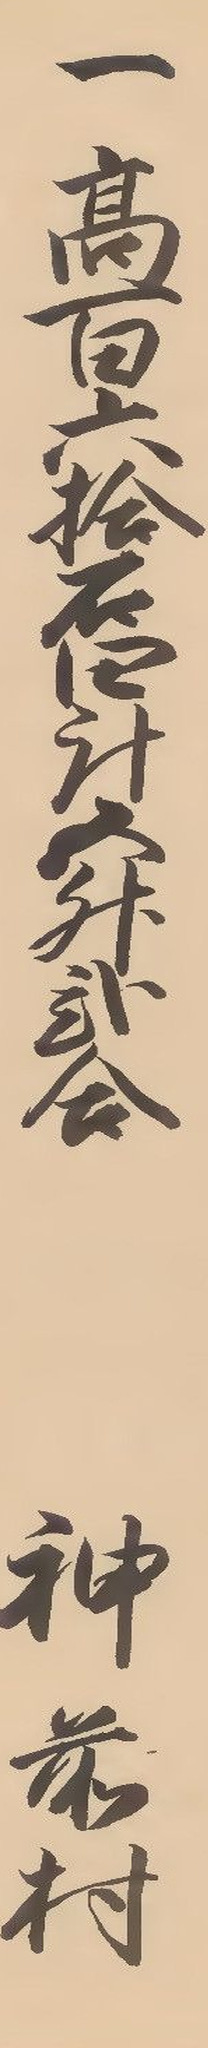一高百六拾石四斗五升弐合神前村
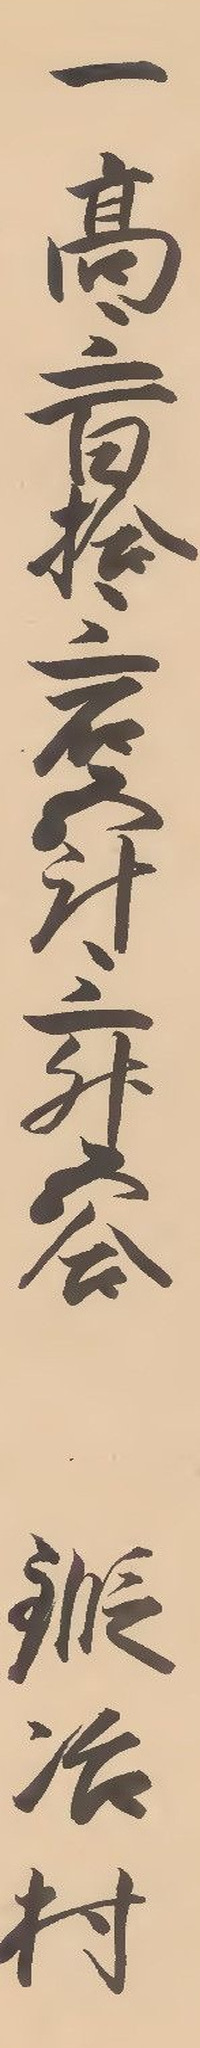一高三百拾三石五斗三升五合鍛冶村
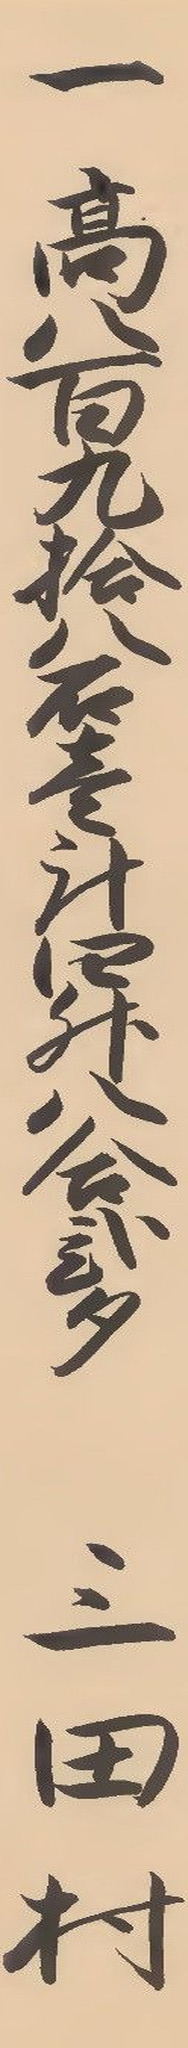一高八百九拾八石壱斗四升八合弐勺三田村
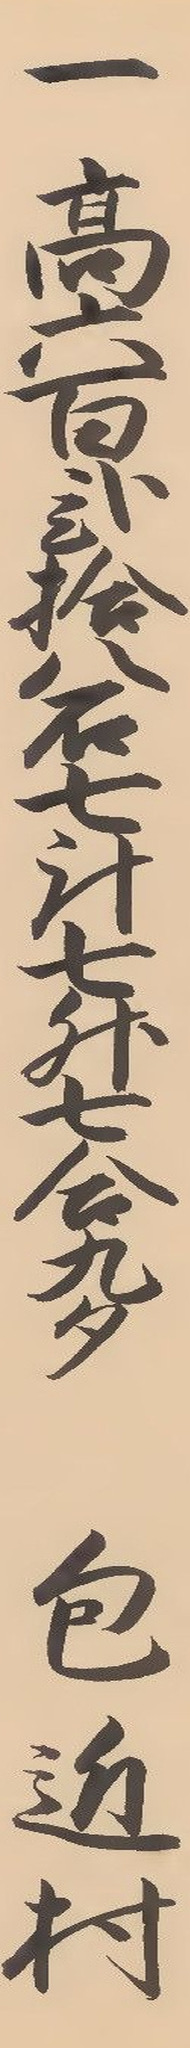一高六百弐拾八石七斗七升七合九勺包近村
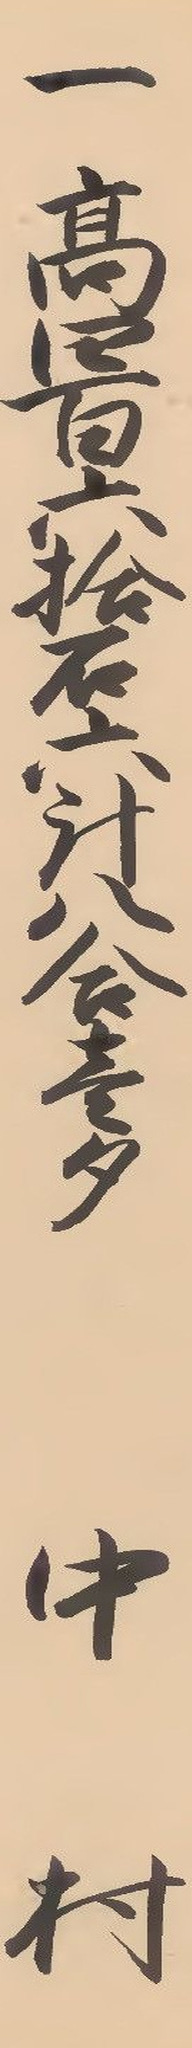一高四百六拾石六斗八合壱勺中村
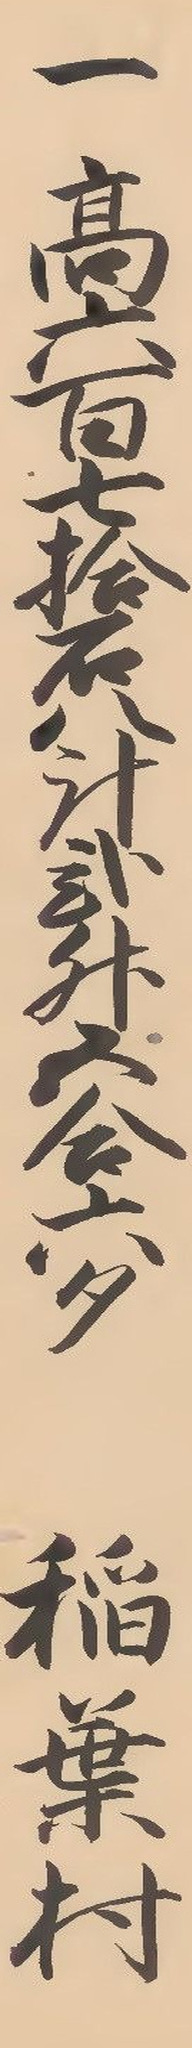一高六百七拾石八斗弐升五合六勺稲葉村

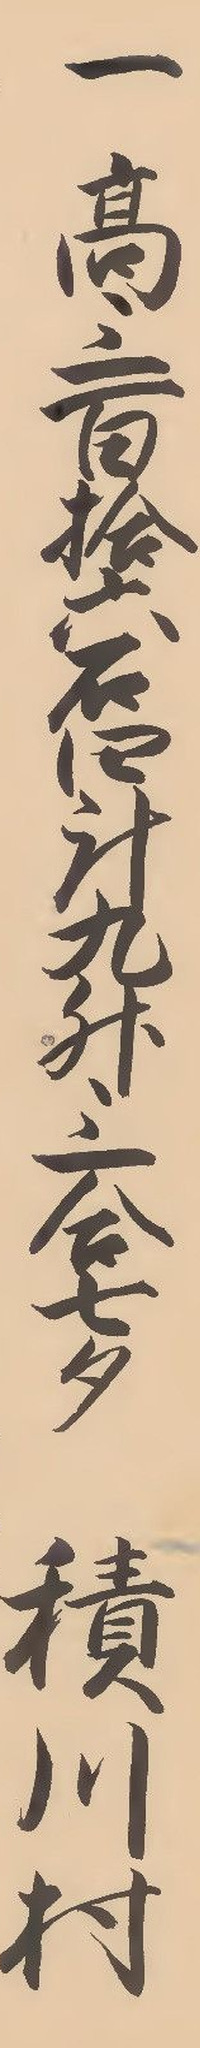一高三百拾六石四斗九升三合七勺積川村
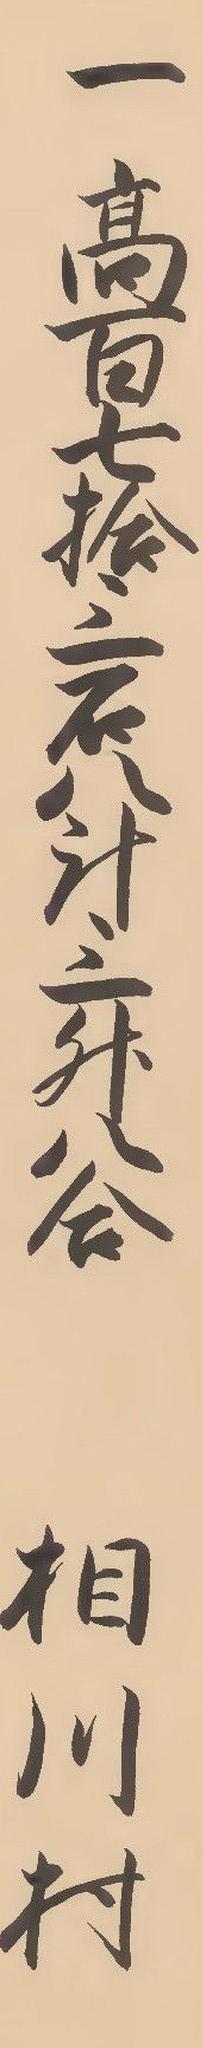一高百七拾三石八斗三升八合相川村
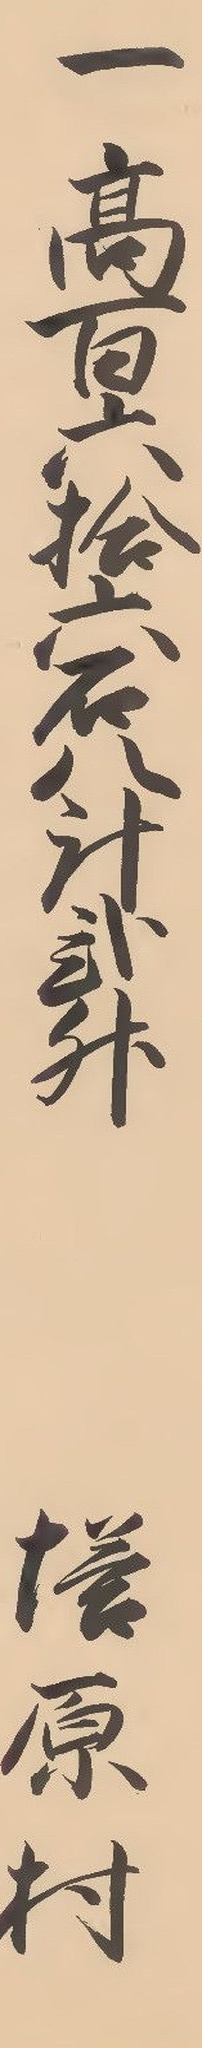一高百六拾六石八斗弐升塔原村
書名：和泉国郷帳
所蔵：国立公文書館 National Archives of Japan
